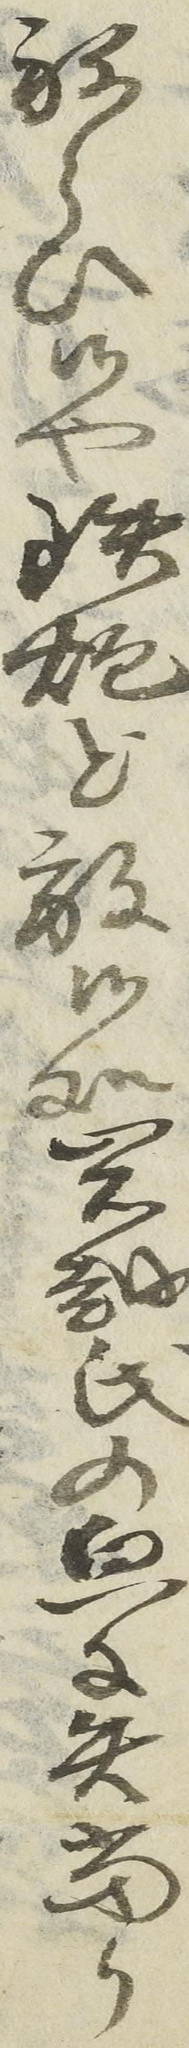ねらひ候や鉄炮を放候処岡越氏の息子矢当り
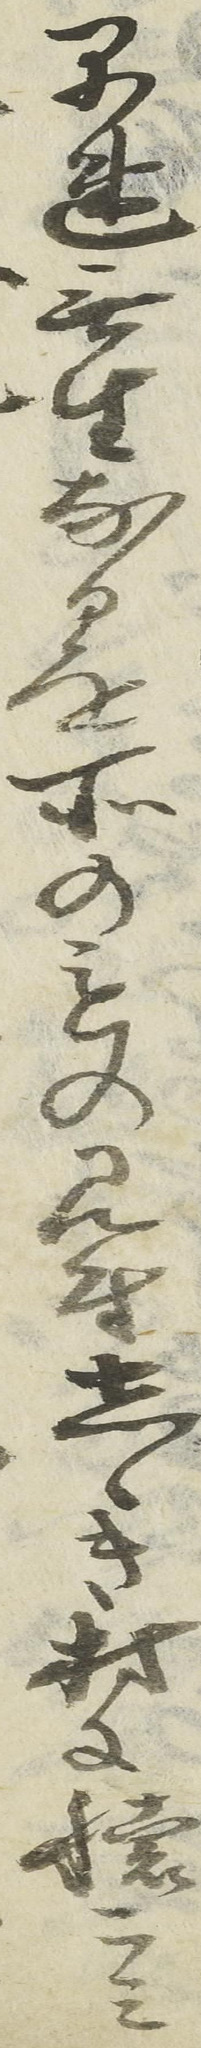早速無生なるを所のもの見付しゝき村に続こみ
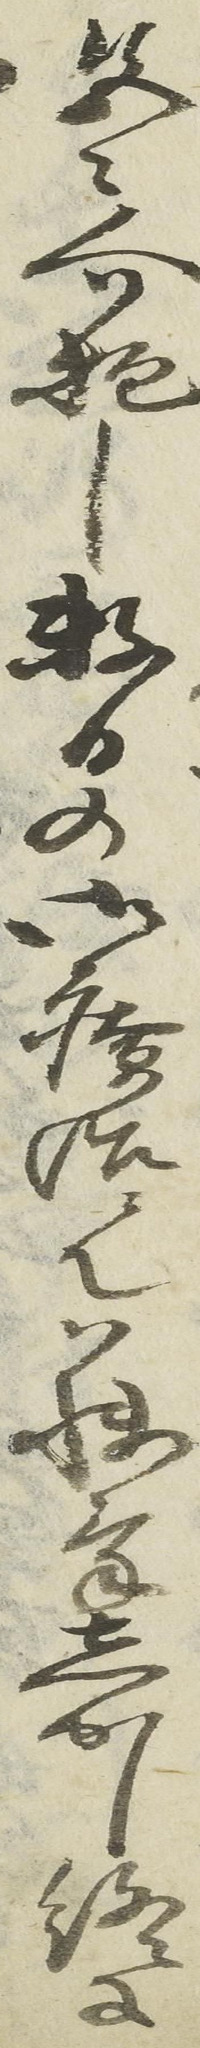色々介抱し数日の御療治ニて御快気しかし終に
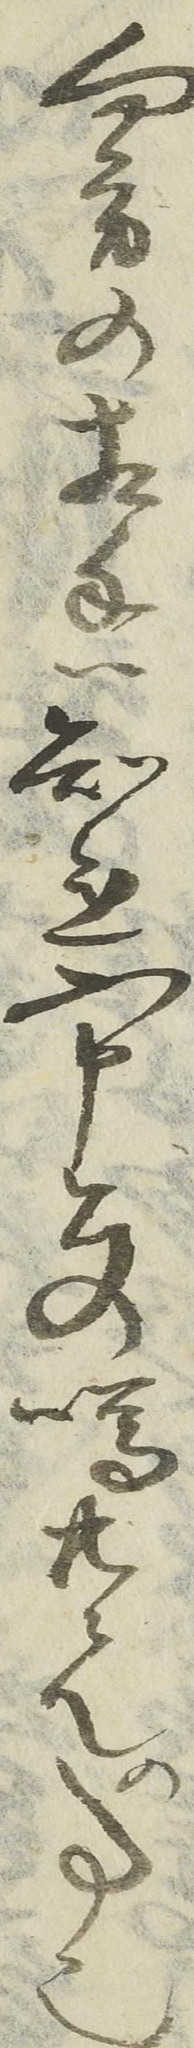向方の相手は知れふ申との噂共ニての事

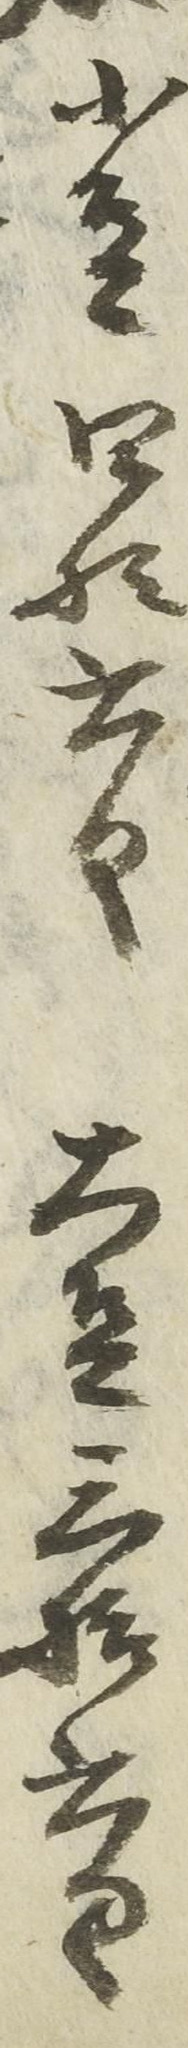小豆四拾六匁大豆三拾六匁
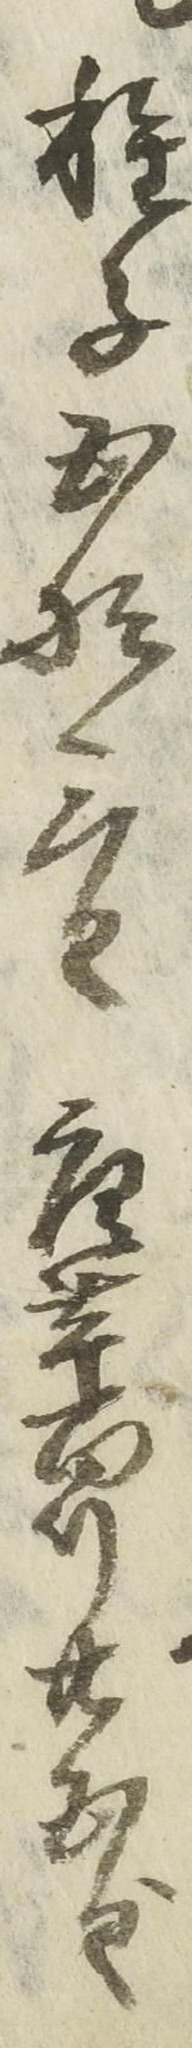種子五拾三匁唐芋百斤廿五匁
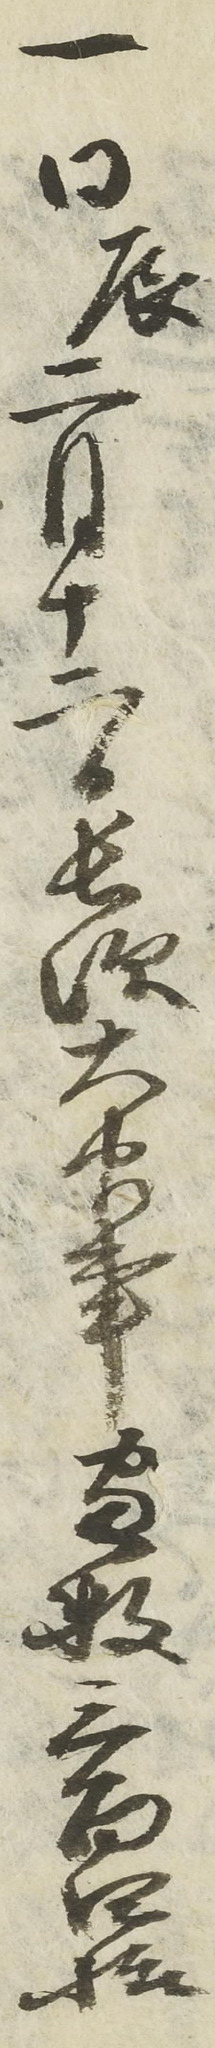一同辰二月十六日長浜大火事家数三百四拾
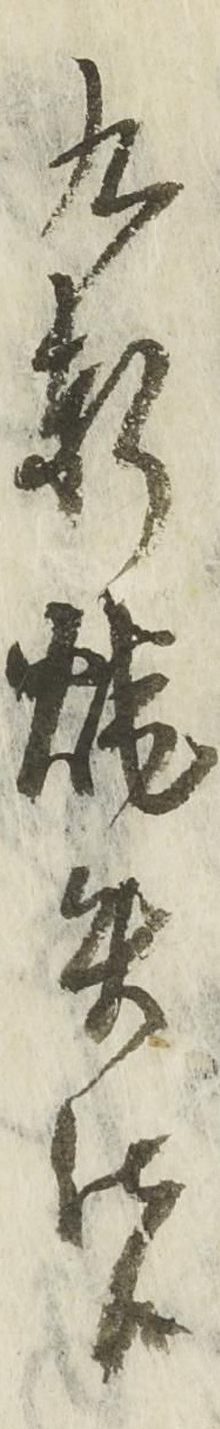九軒焼失仕候
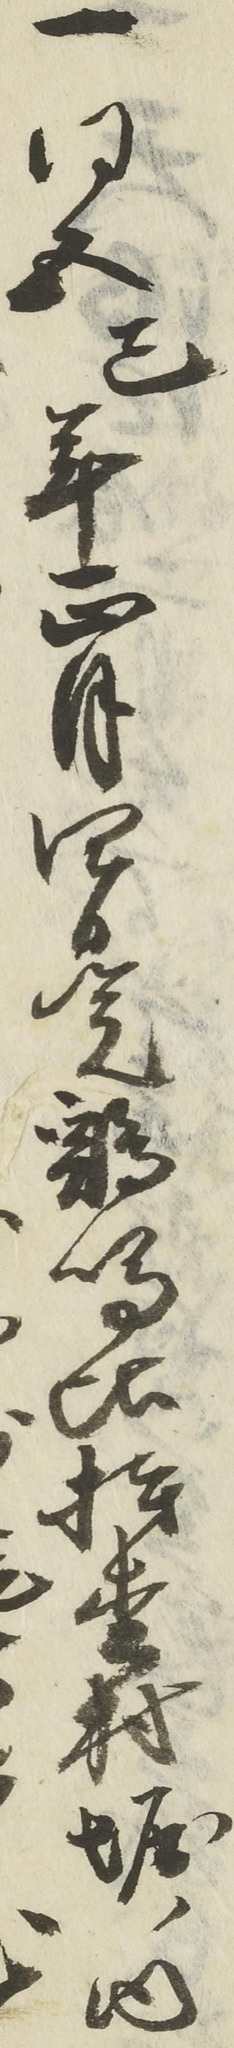一同五巳年正月四日暁鶴鳴頃持堂村堀ノ内
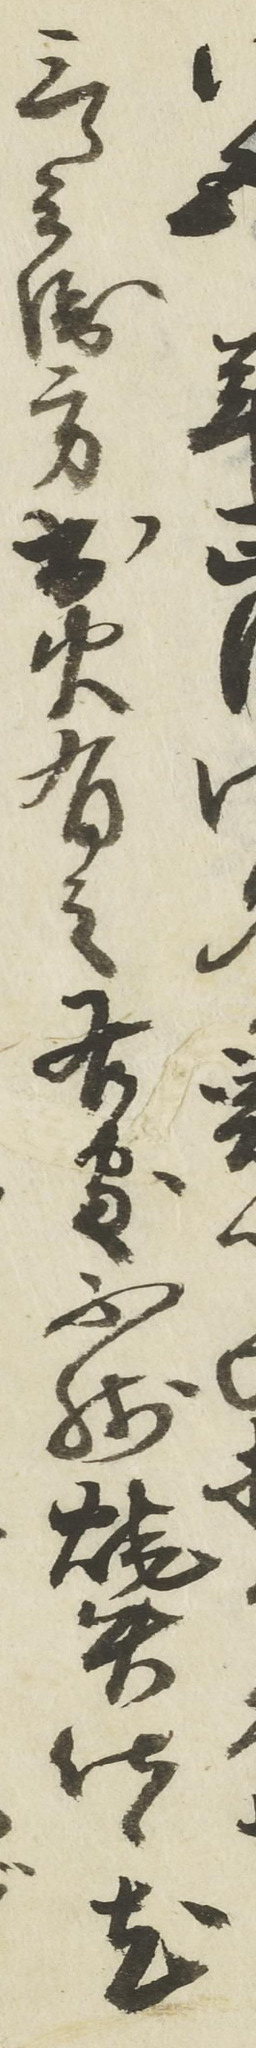三郎兵衛方出火有之居家不残焼失仕候尤
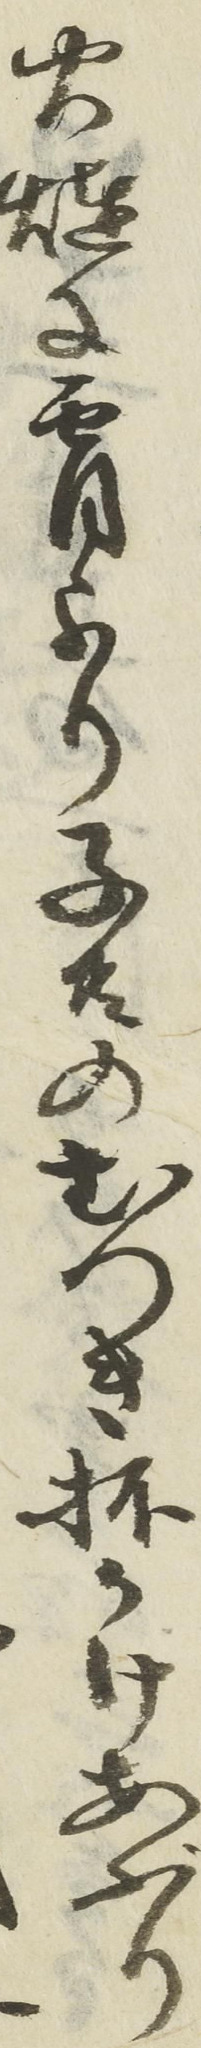火燵に宵より子共のむつき抔かけあぶり
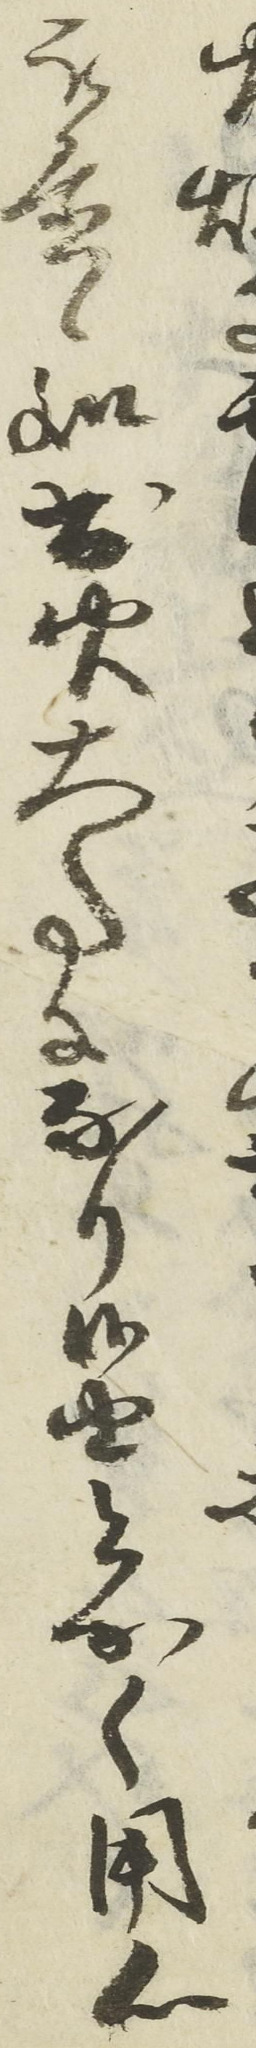罷有候処出火大事に至り候由とかく用心
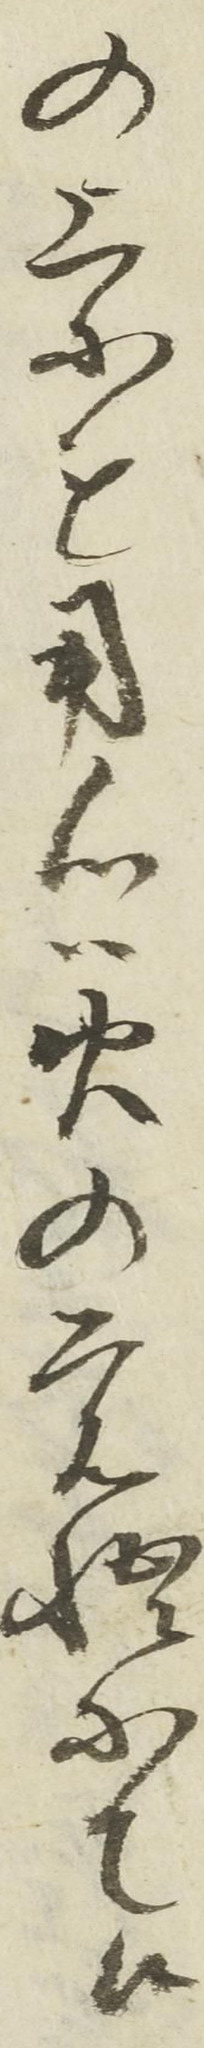の上にも用心は火の覚悟にて候
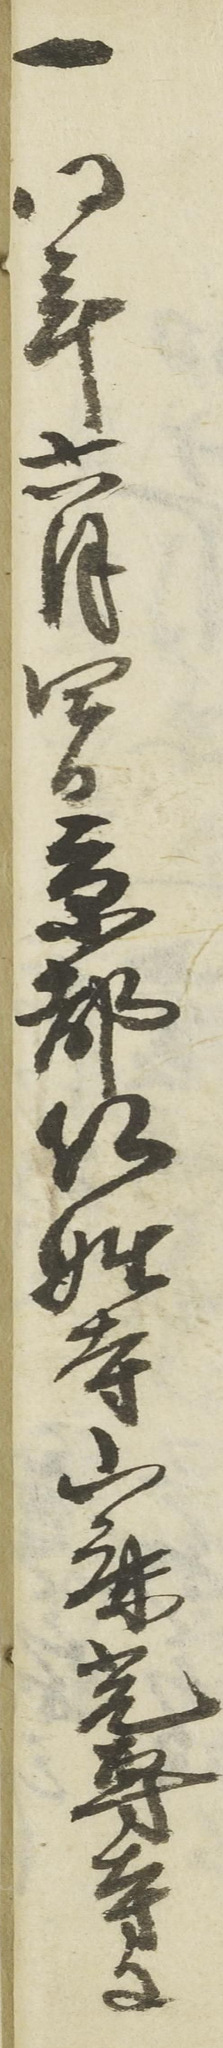一同年六月四日京都仏姓寺山鹿光尊寺に
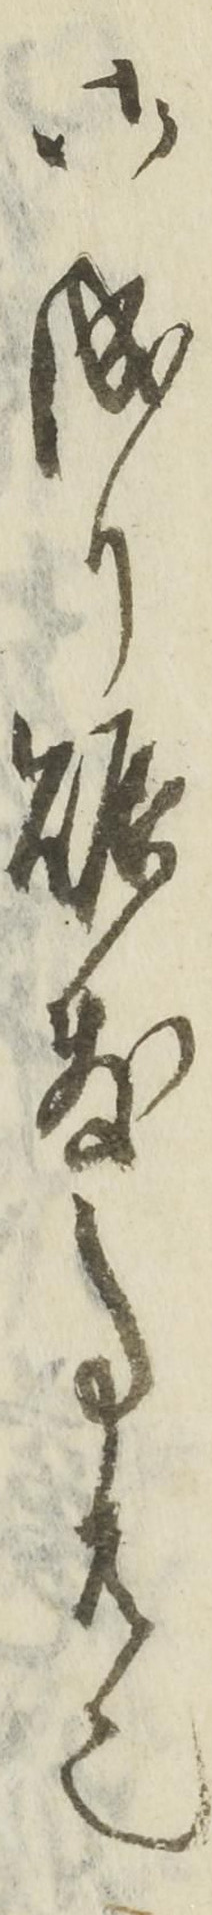御成り賑敷事共也
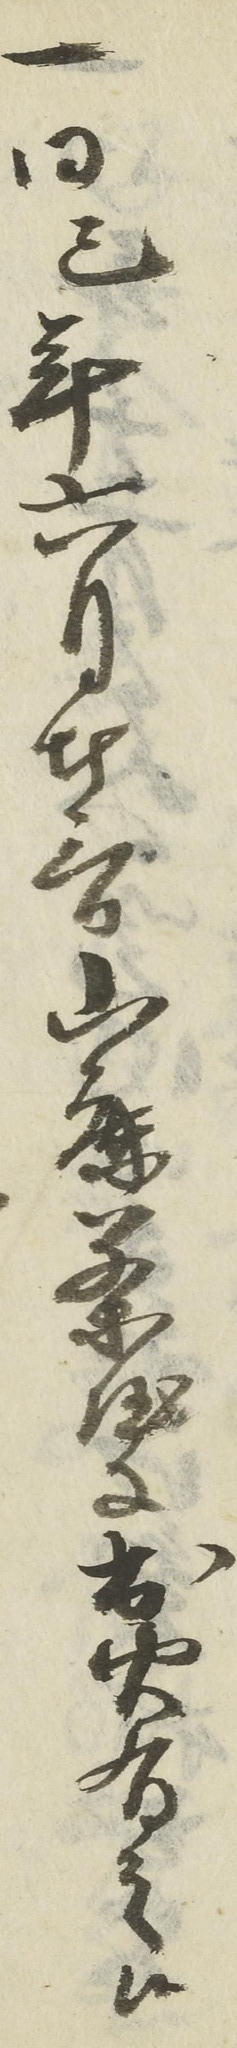一同巳年六月廿三日山鹿茶屋に出火有之候
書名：後見笑
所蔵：東京大学地震研究所図書室 Earthquake Research Institute Library, The University of Tokyo, JAPAN
